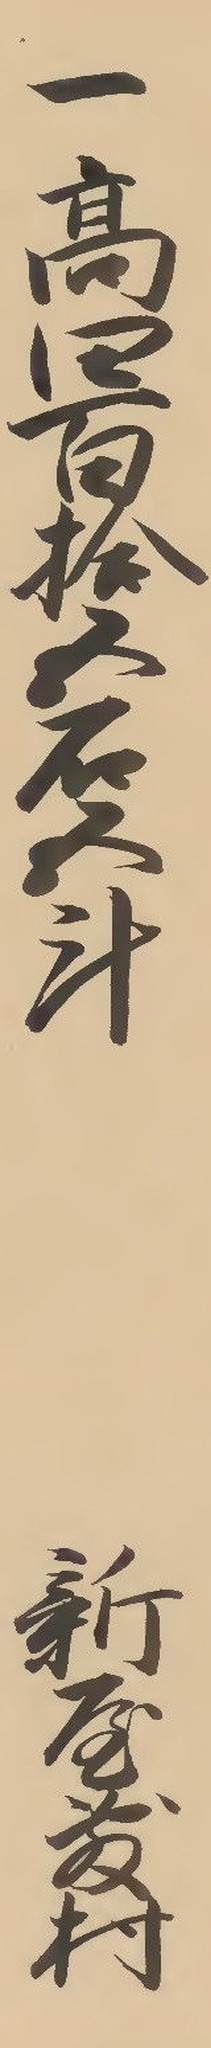一高四百拾五石五斗新屋敷村
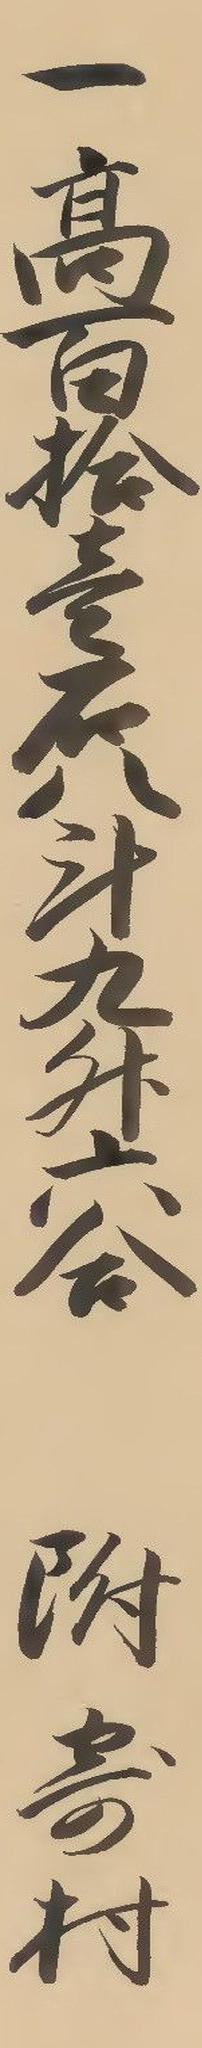一高百拾壱石八斗九升六合附寄村
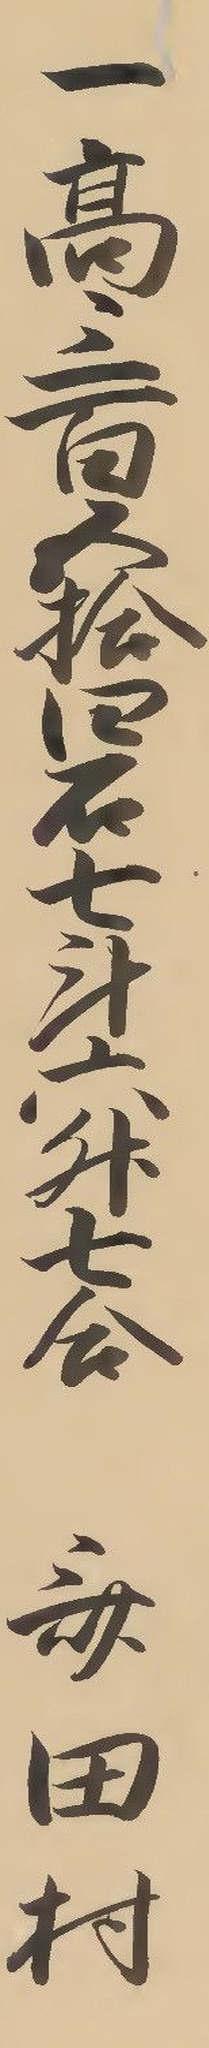一高三百五拾四石七斗六升七合斎田村
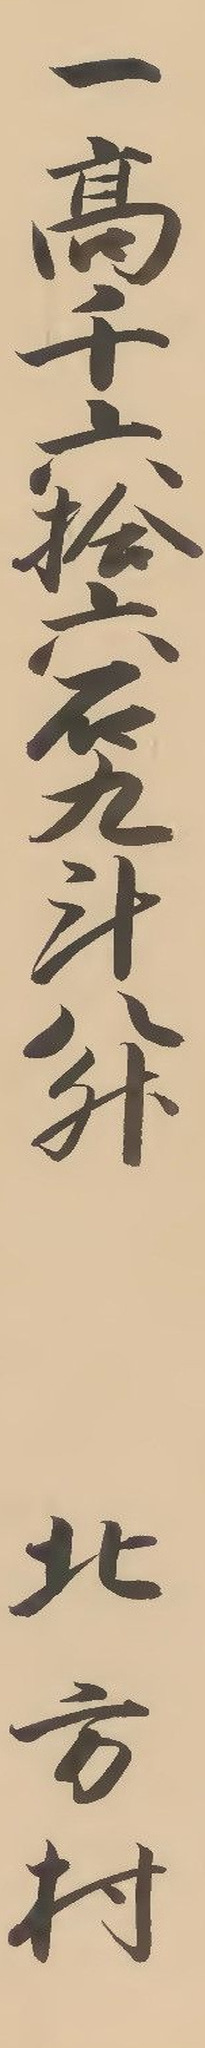一高千六拾六石九斗八升北方村

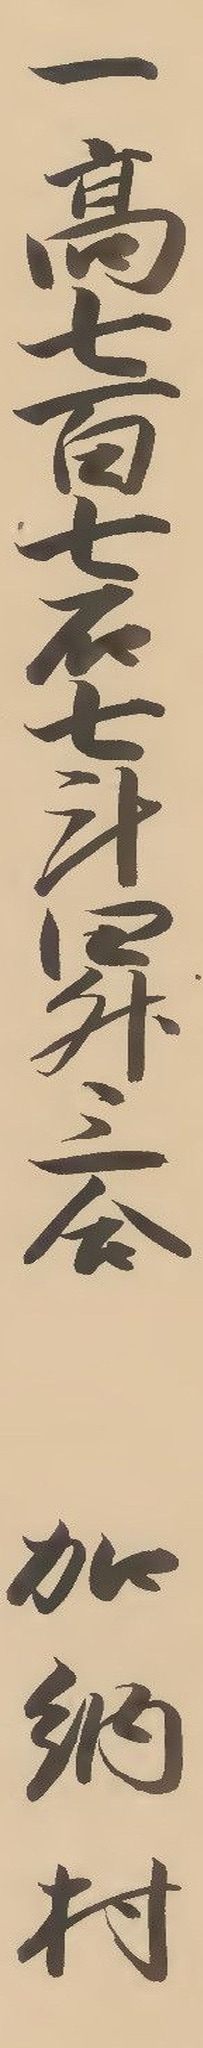一高七百七石七斗四升三合加納村
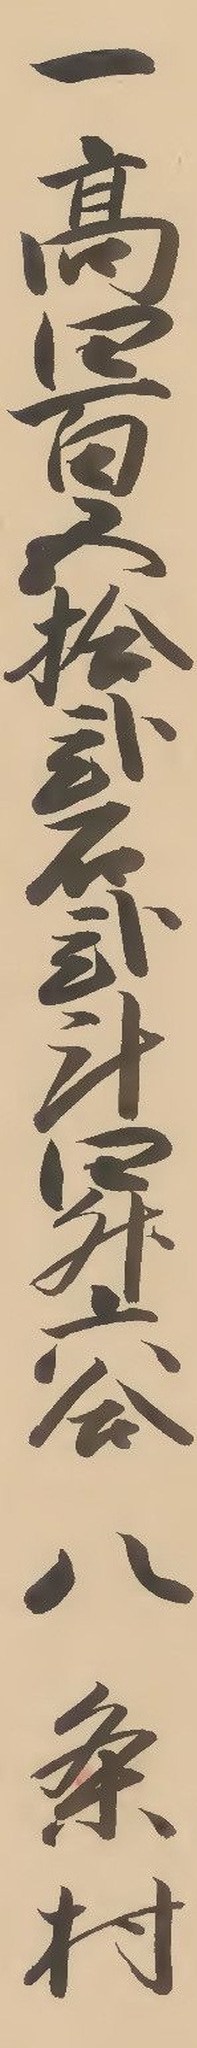一高四百五拾弐石弐斗四升六合八条村
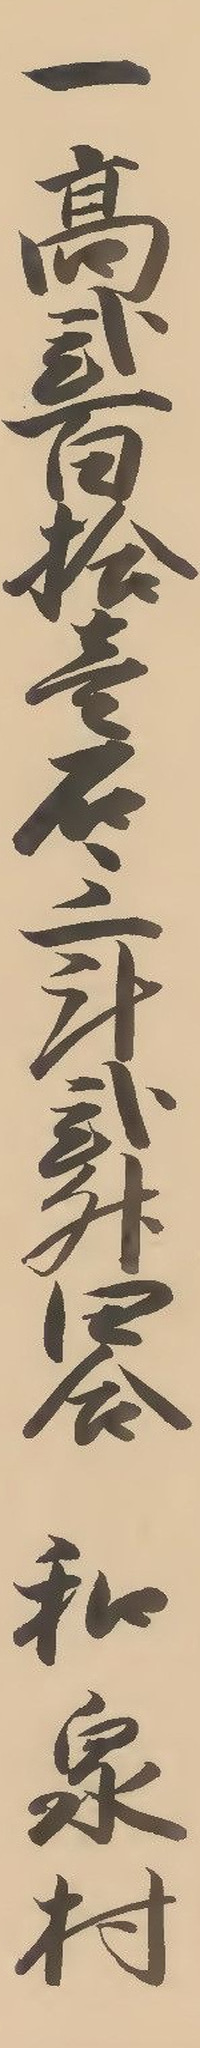一高弐百拾壱石三斗弐升四合和泉村
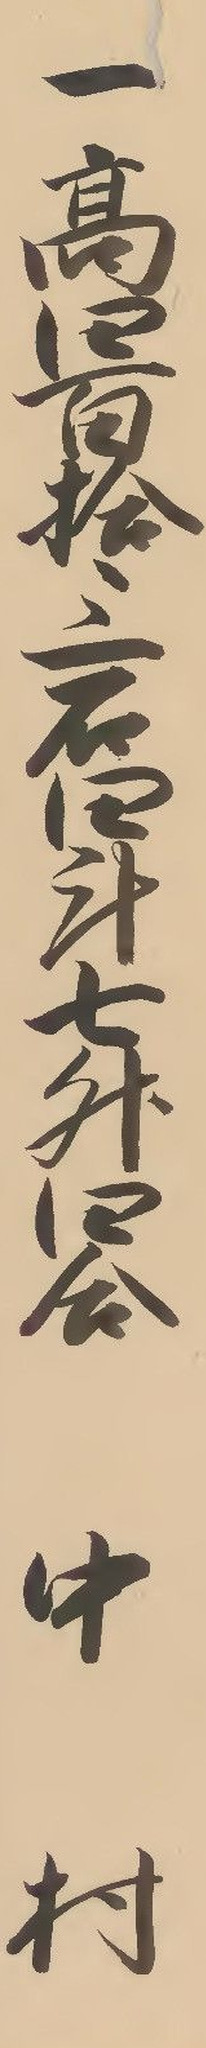一高四百拾三石四斗七升四合中村
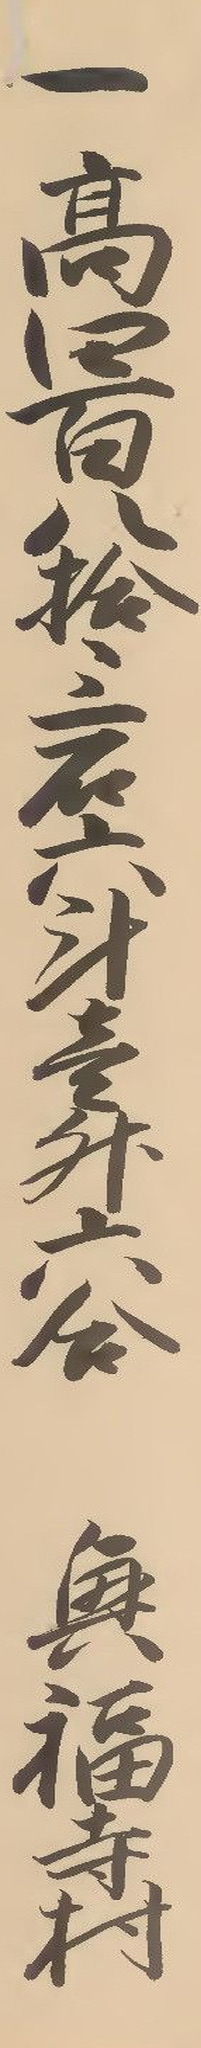一高四百八拾三石六斗壱升六合興福寺村
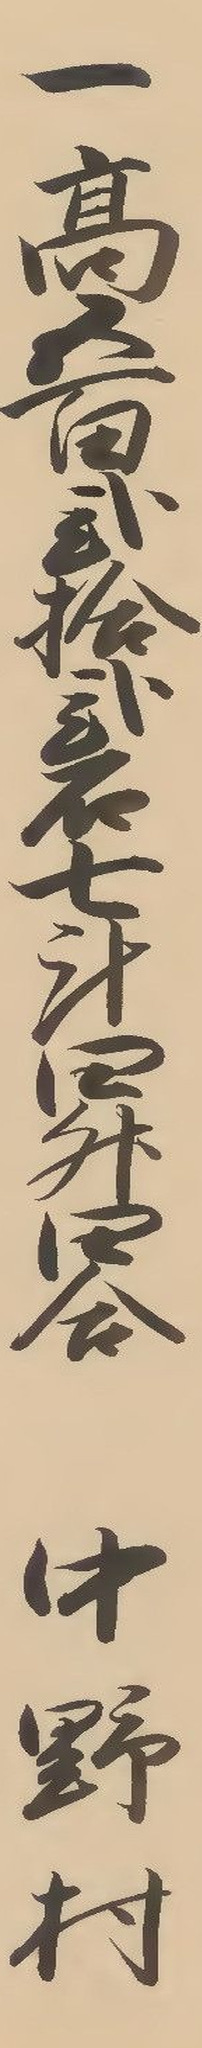一高五百弐拾弐石七斗四升四合中野村
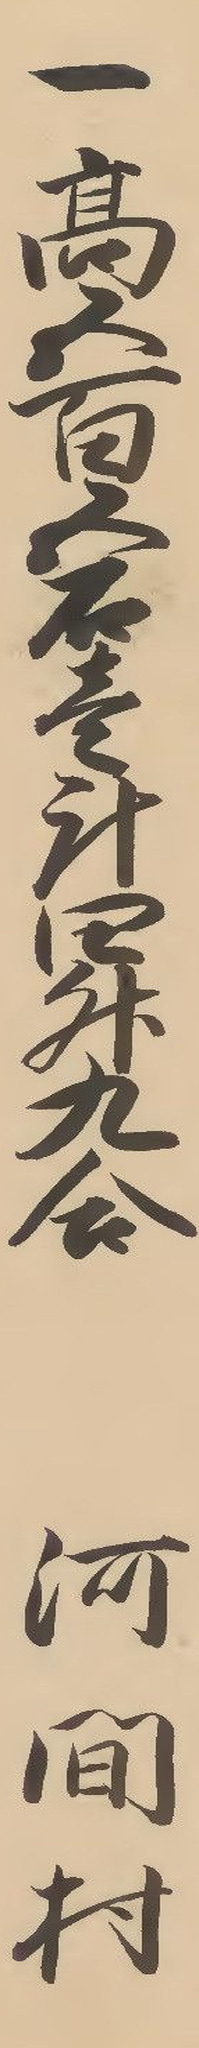一高五百五石壱斗四升九合河間村
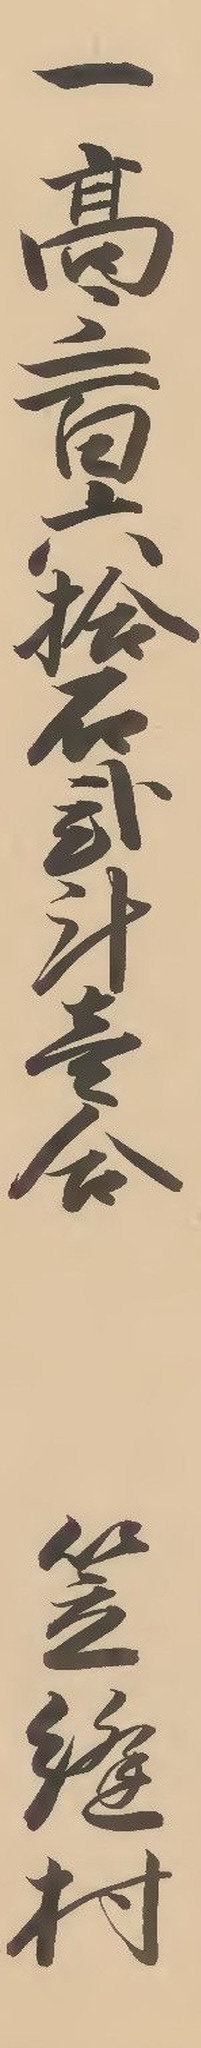一高三百六拾石弐斗壱合笠縫村

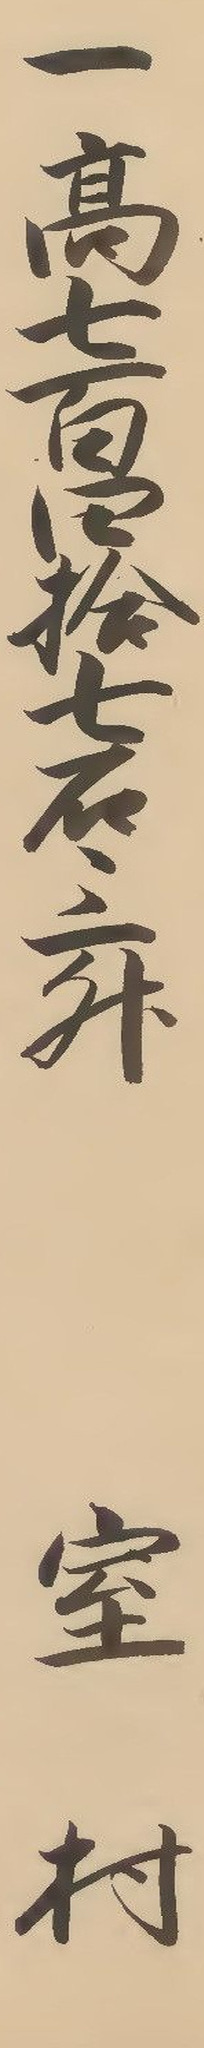一高七百四拾七石三升室村
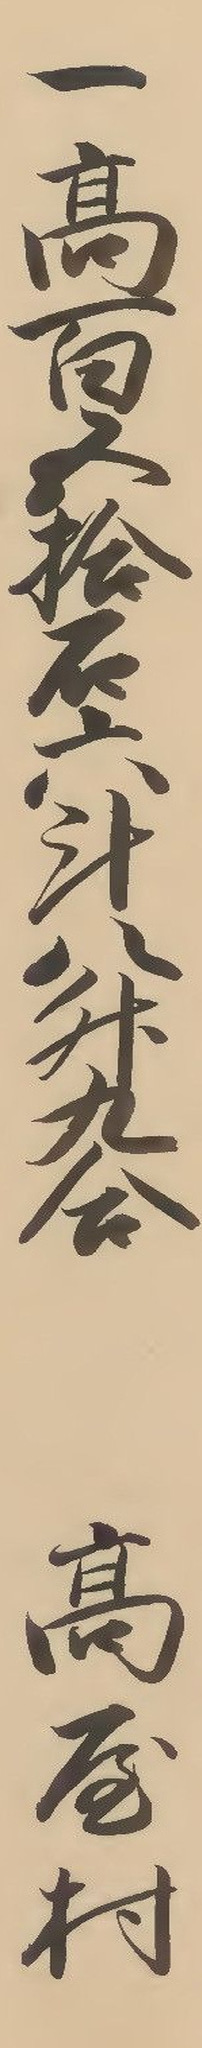一高百五拾石六斗八升九合高屋村
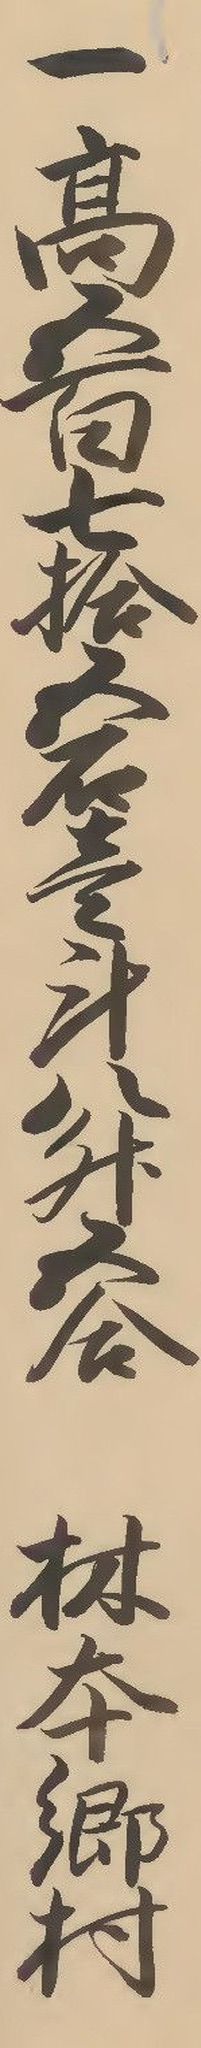一高五百七拾五石壱斗八升五合林本郷村
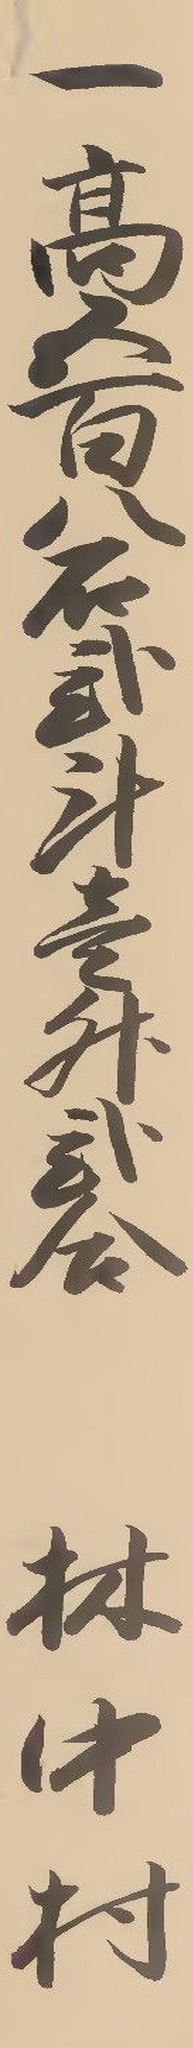一高五百八石弐斗壱升弐合林中村
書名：美濃国郷帳
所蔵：国立公文書館 National Archives of Japan
